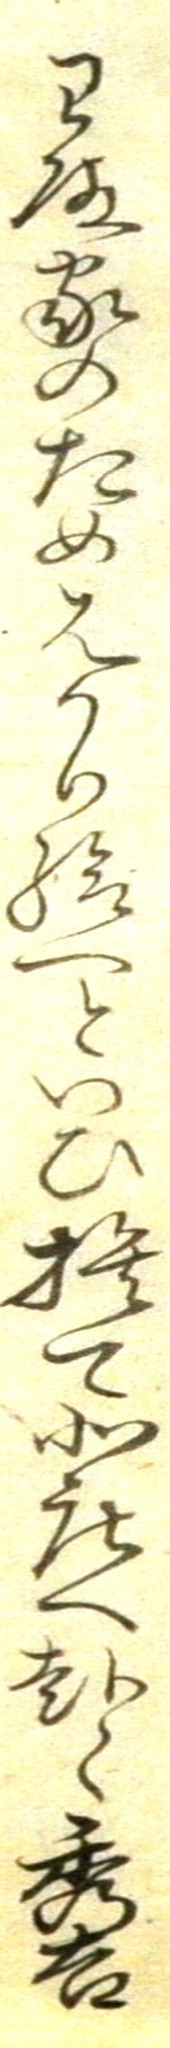わ殿家のためはかり給へといひ捨て北庄へ赴く秀吉
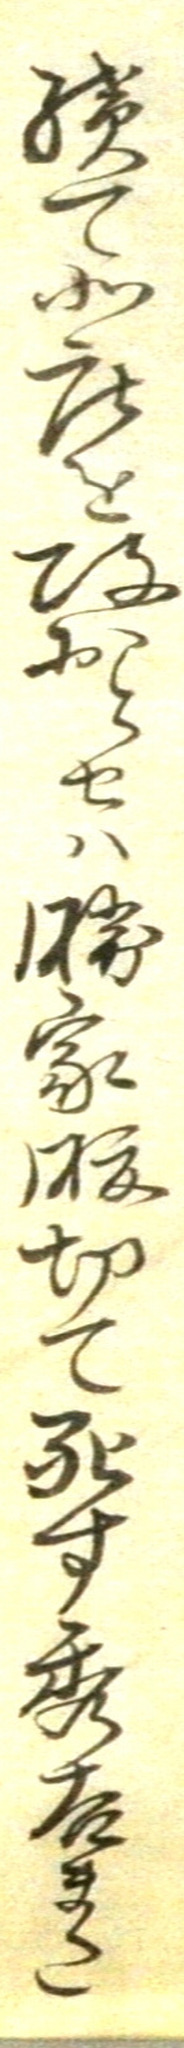続て北庄を攻おとせは勝家腹切て死す秀吉また
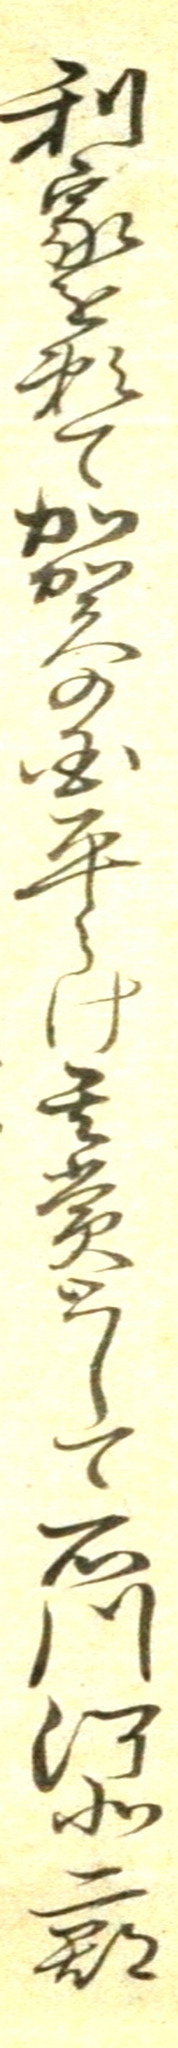利家を頼て加賀の国平らけ其賞として石川河北二郡
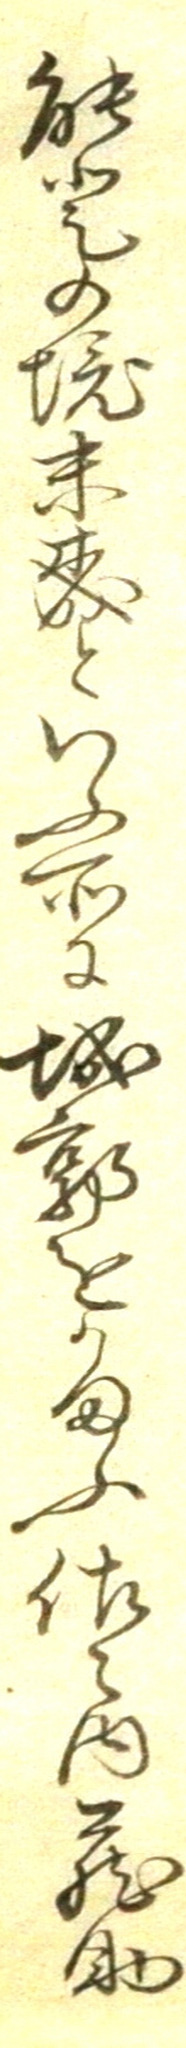能登の境末森といふ所に城郭をたまふ佐々内蔵助
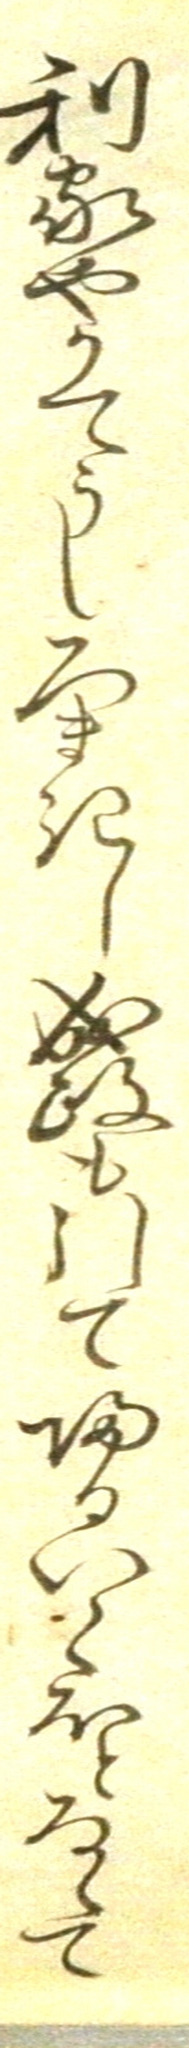利家やかてうしろまきし成政も引て帰るいくほとなくて
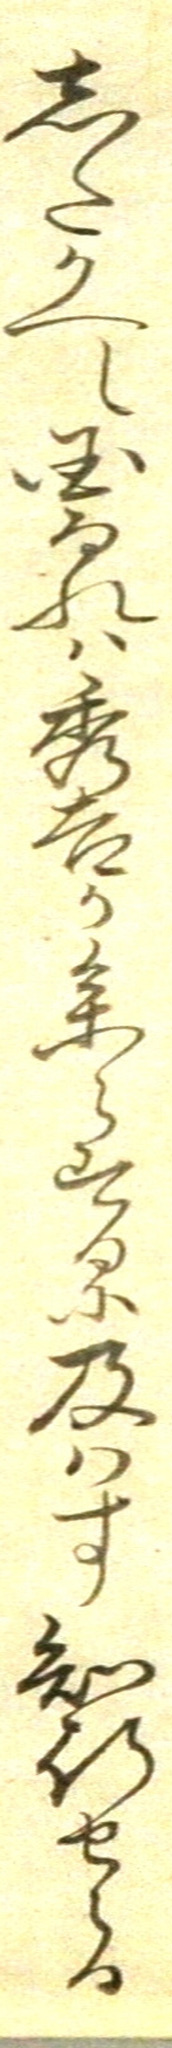したかへし国なれは秀吉か参らするに及はす知行せらる
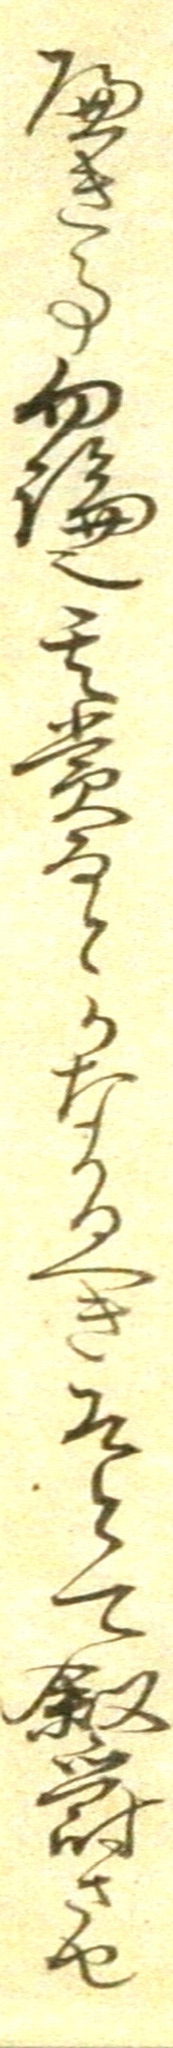へき事勿論也其賞なとかなかるへきそとて叙爵させ
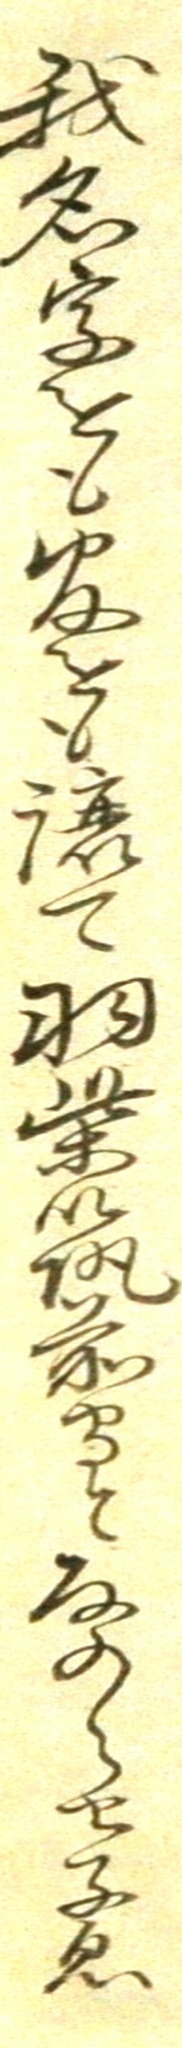我名字をも官をも譲て羽柴筑前守となのらせ子息
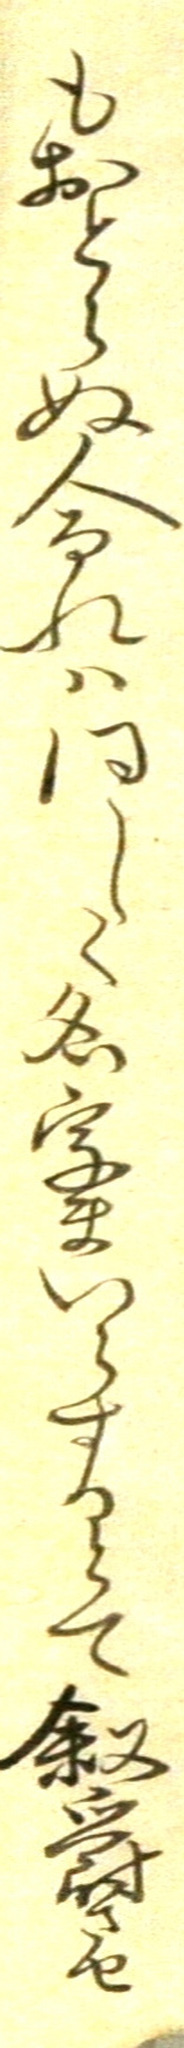もおとらぬ人なれは同しく名字まいらするとて叙爵させ

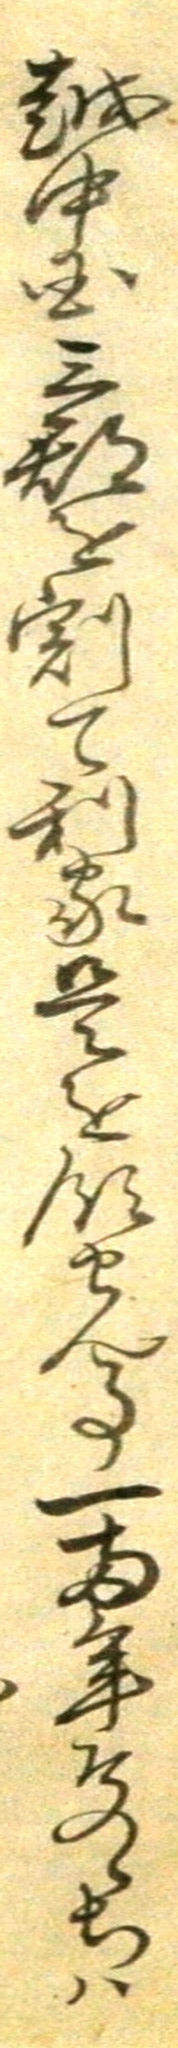越中国三郡を割て利家是を領せん事一両年そのゝちは
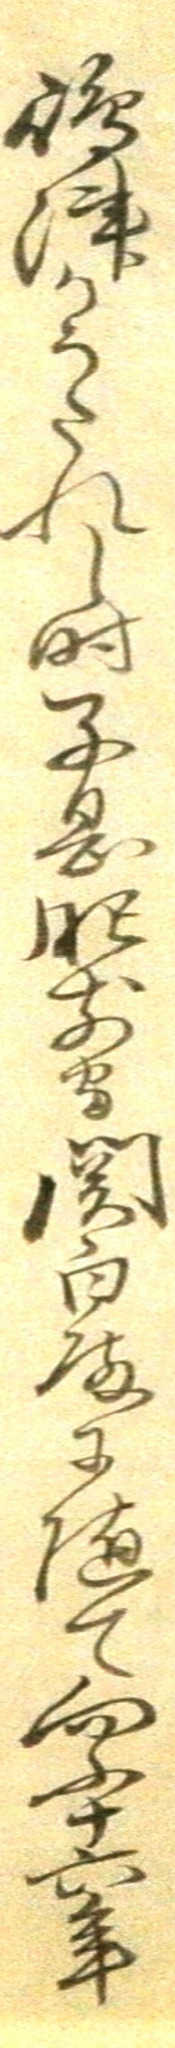島津かうたれし時子息肥前守関白殿に随て向ふ十六年
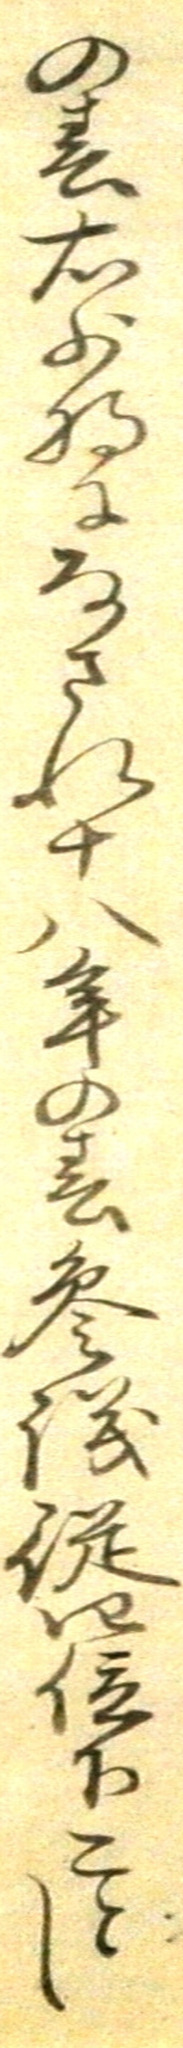の春右少将になされ十八年の春参議従四位下ことし
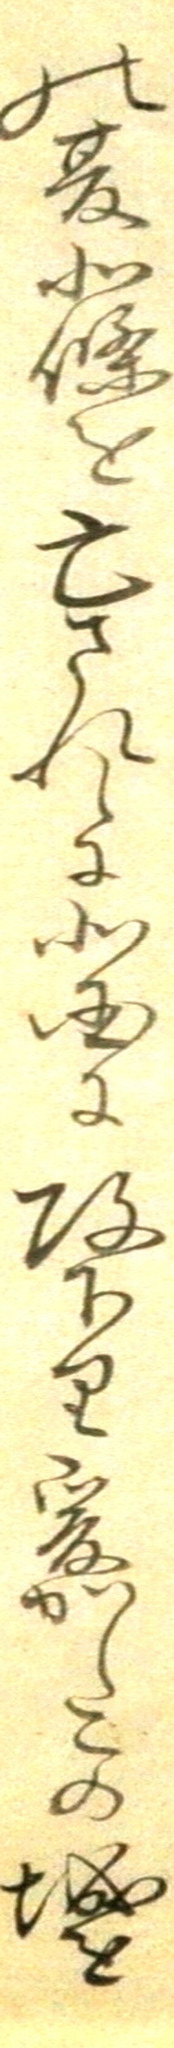の夏北条を亡されしに北国に攻下り爰かしこの城を
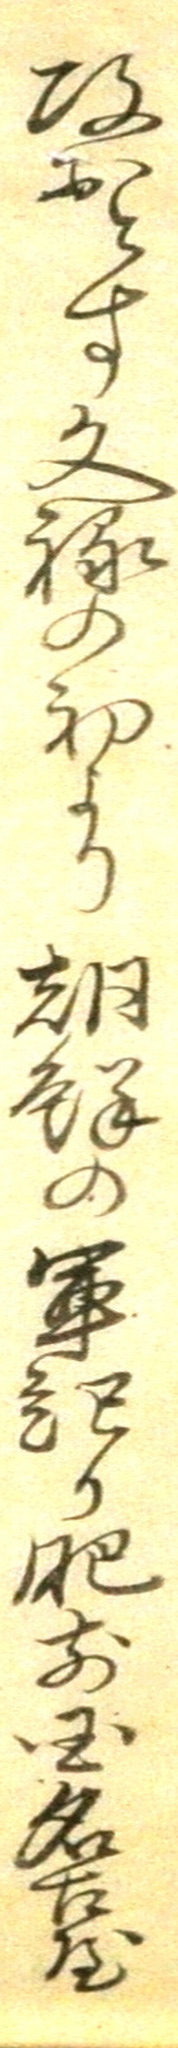攻おとす文禄のは初より朝鮮の軍起り肥前国名古屋
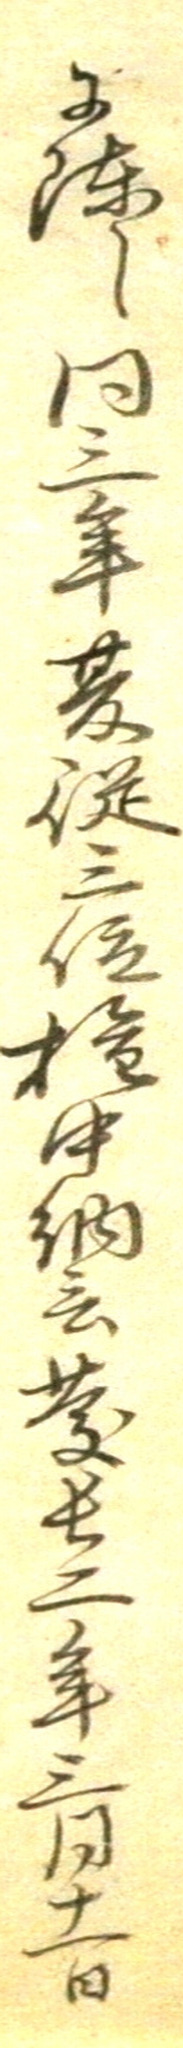に陣し同三年夏従三位権中納言慶長二年三月十一日
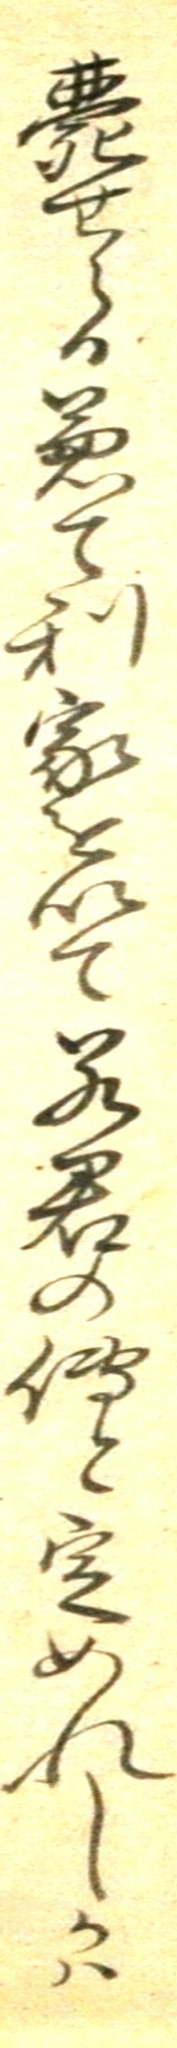薨せしか兼て利家を以て若君の傅と定めれしかは
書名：藩翰譜（七・上）
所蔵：伊那市立高遠町図書館・合同会社AMANE
